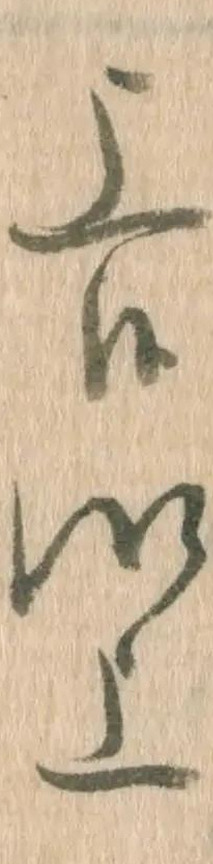上候以上
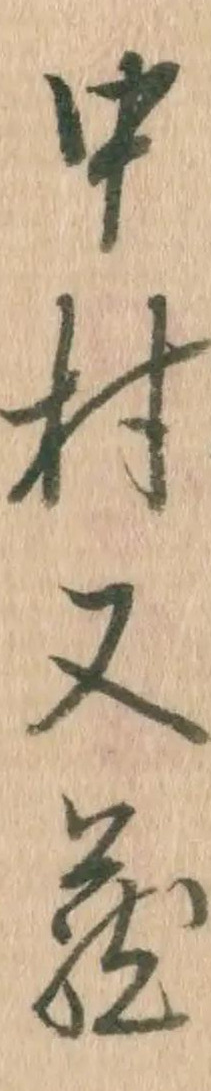中村又蔵
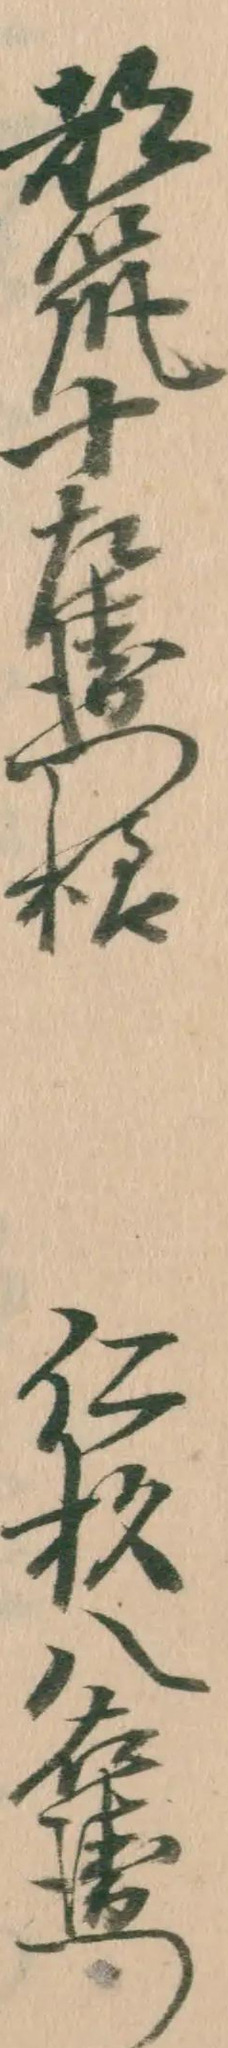都筑十左衛門様仁杉八右衛門
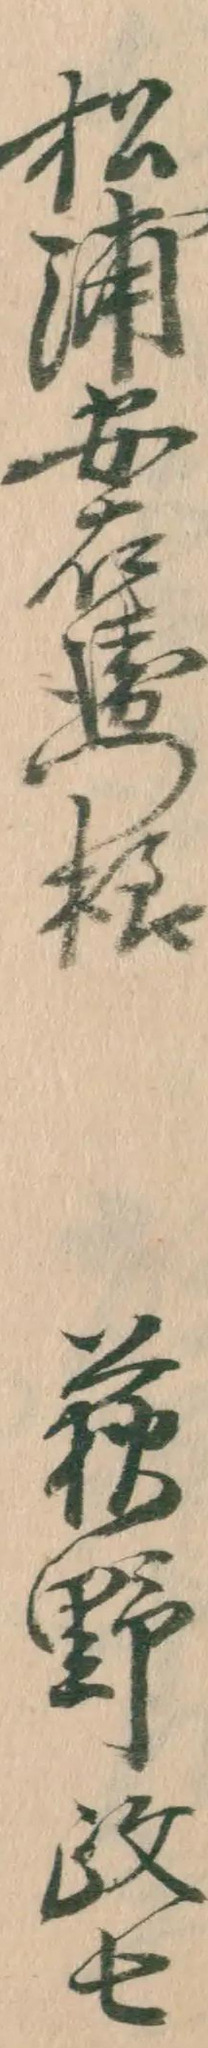松浦安右衛門様荻野政七
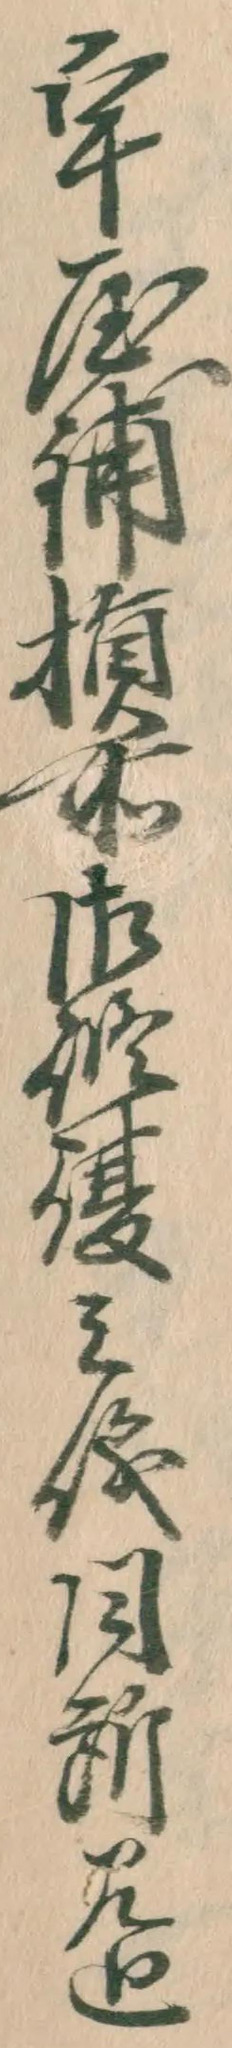牢屋鋪損所御修復之儀同所見廻
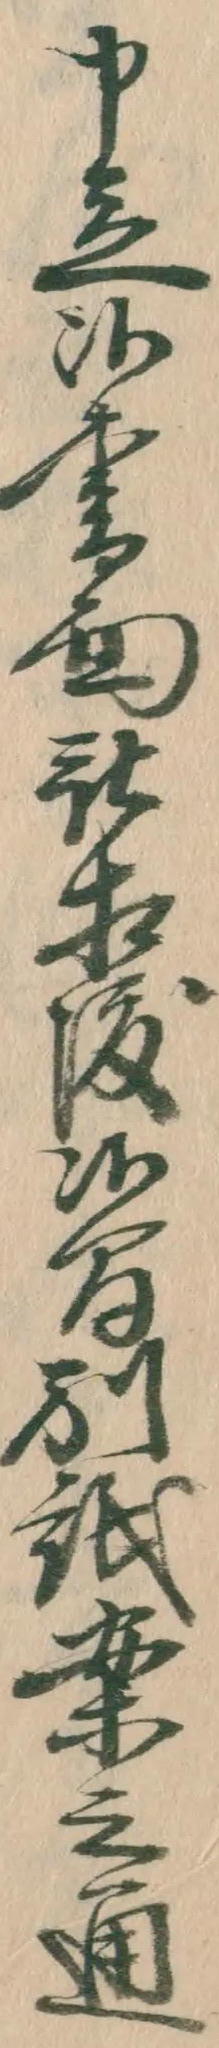申立候書面被相渡候間別紙案之通
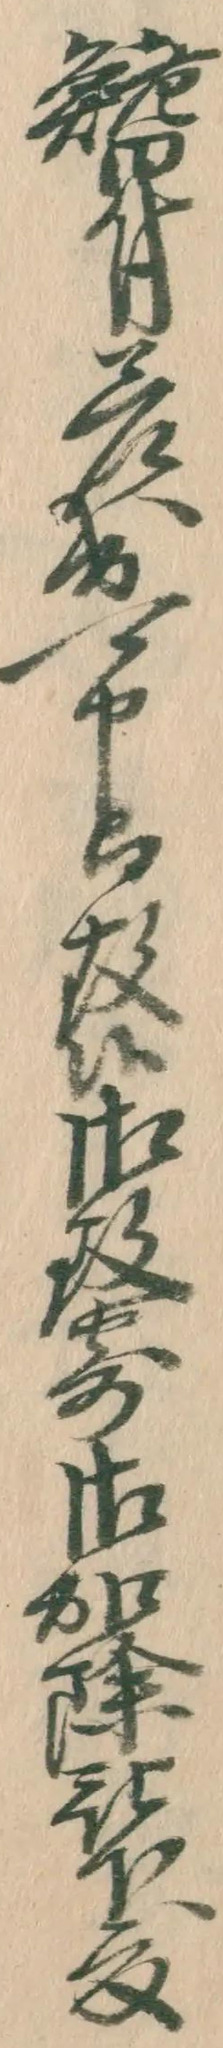鰭付差出可申と存候御存寄御加除被下度
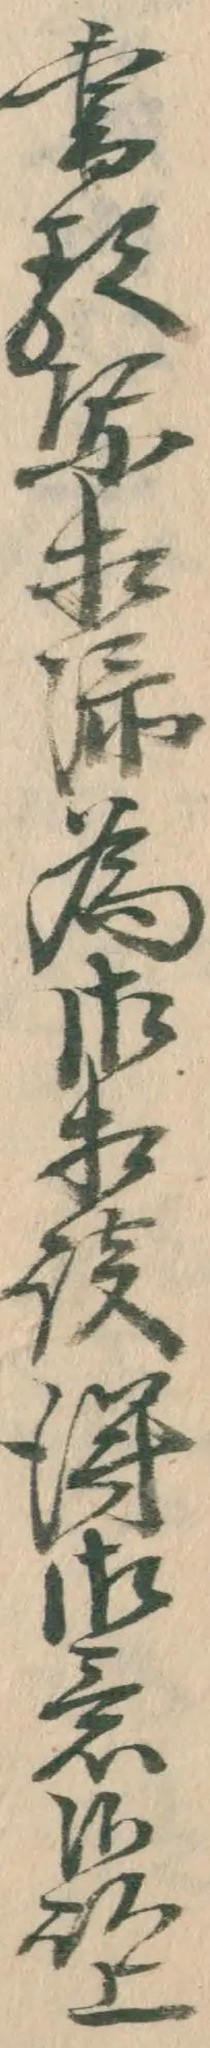書類写相添為御相談得御意候以上
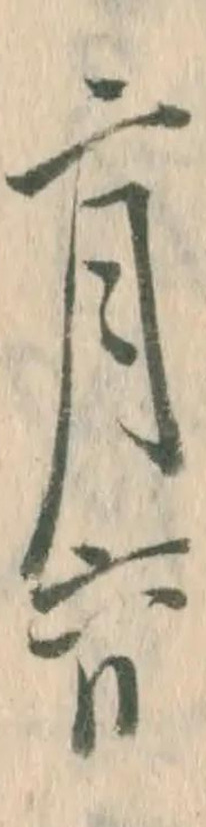二月六日

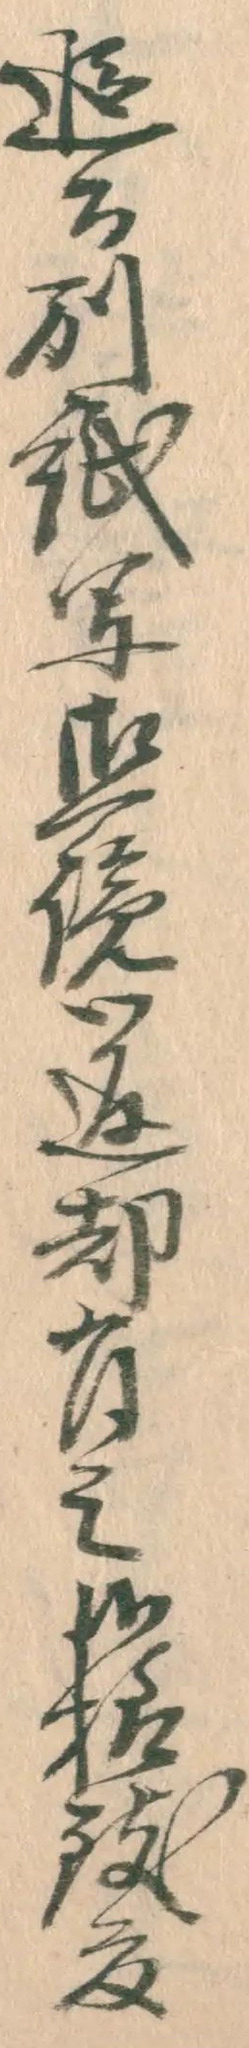追て別紙写御覧御返却有之候様致度
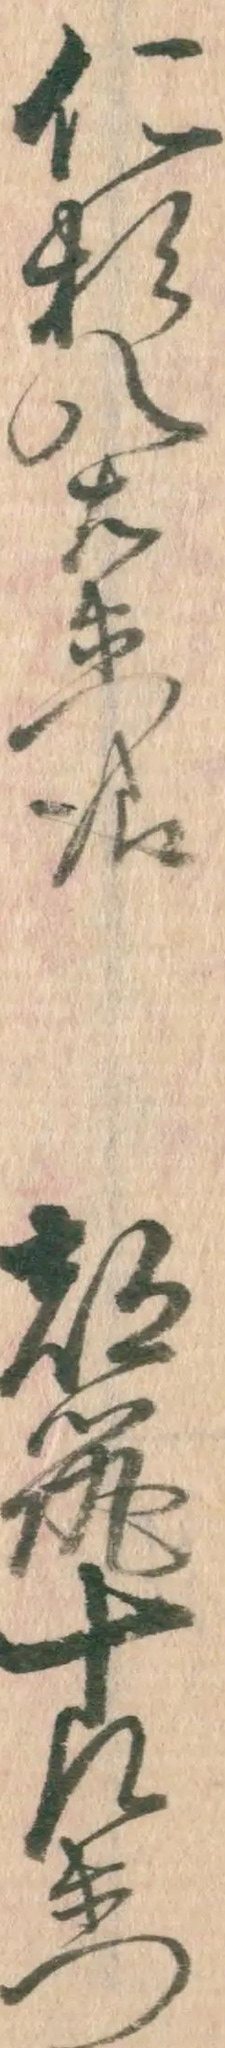仁杉八右衛門様都筑十左衛門
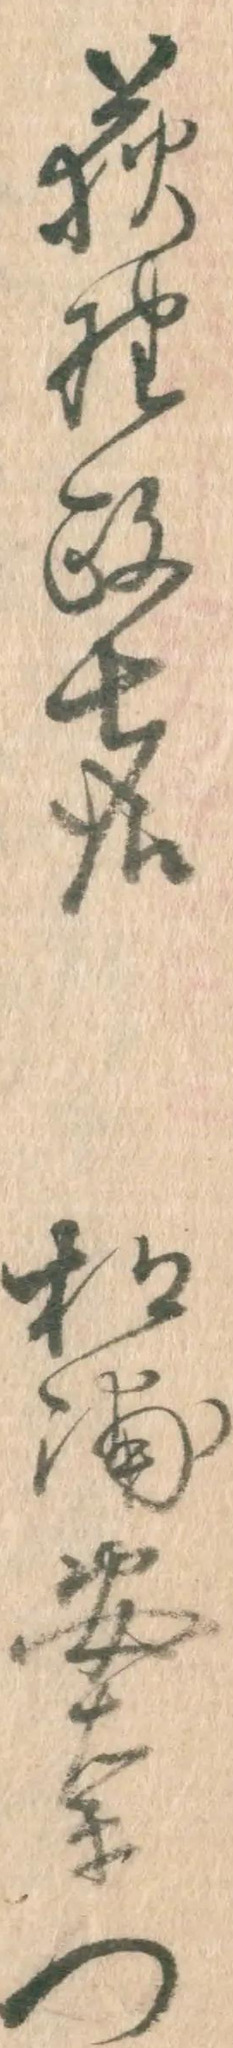荻野政七様松浦安右衛門
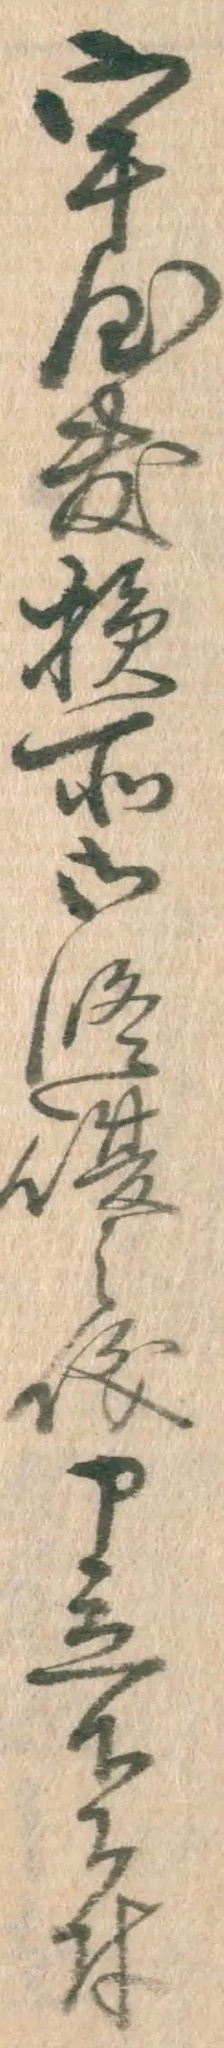牢屋敷損所御修復之儀申立候ニ付
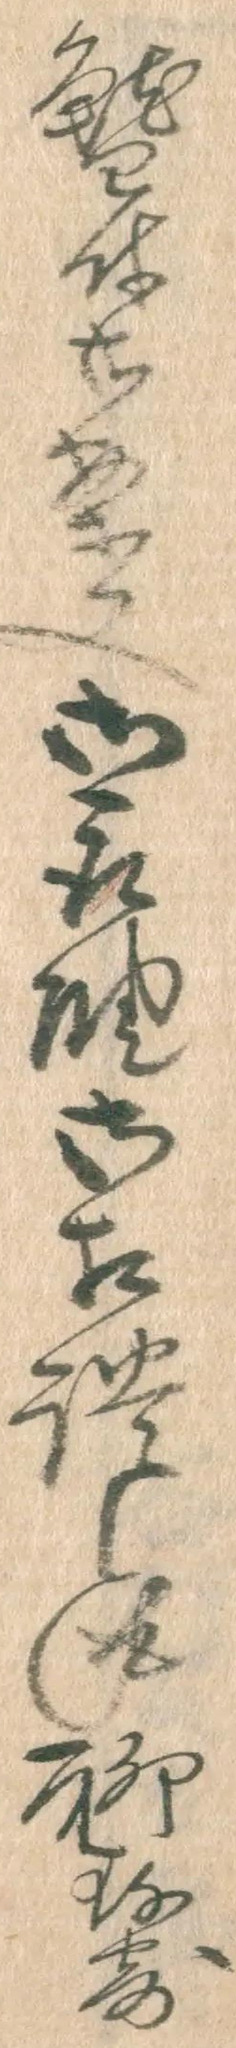鰭付共案文御取調御相談之趣聊存寄
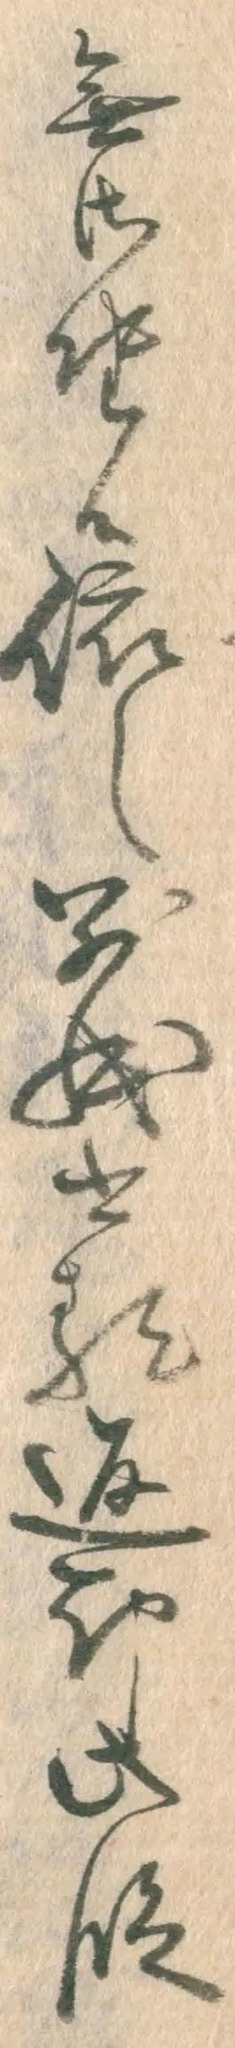無御座候依之別紙書類返却此段
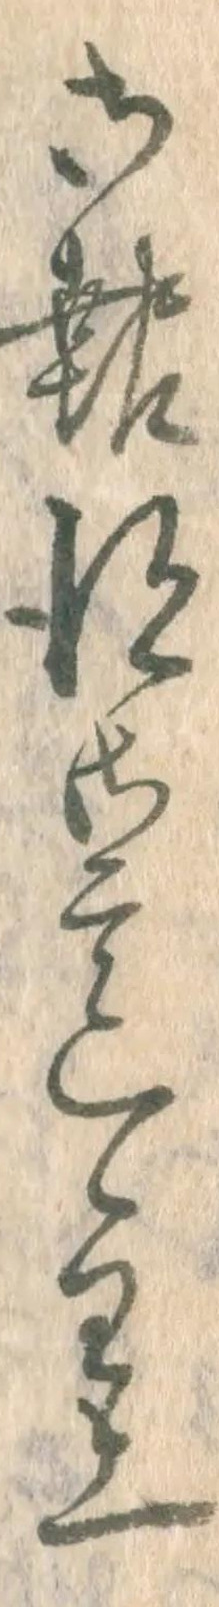御報得御意候已上
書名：七十冊物類集 71巻. [44] 四十三 牢屋敷御普請御修覆地震ニ付骨折候牢屋掛御褒美之部
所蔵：国立国会図書館 National Diet Library, JAPAN
